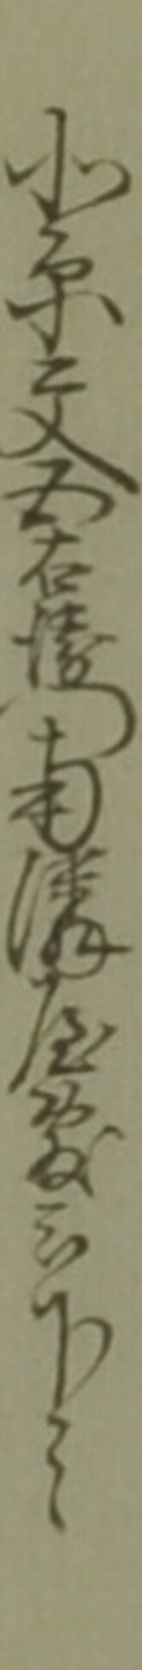北原文五右衛門南隣屋敷被下之
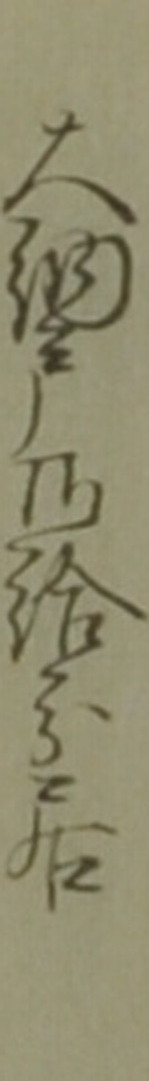大納戸御給分居
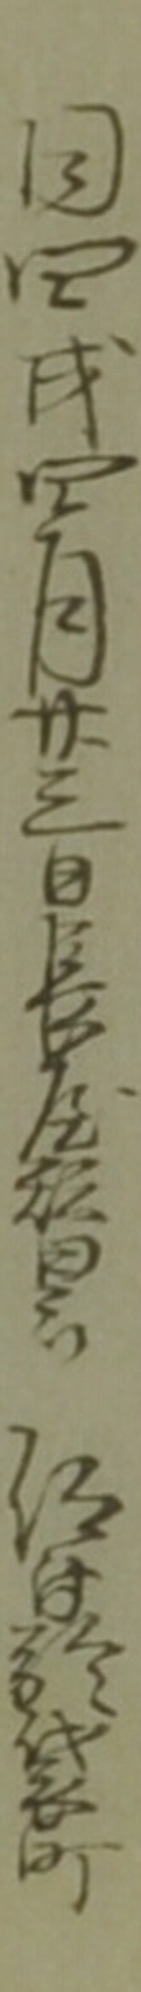一同四戌四月廿三日長屋替被仰付於袋町
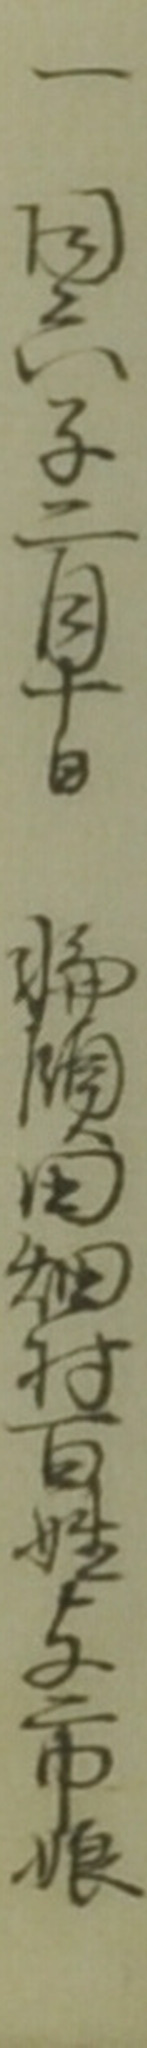一同六子二月十日輪領田畑村百姓与市娘
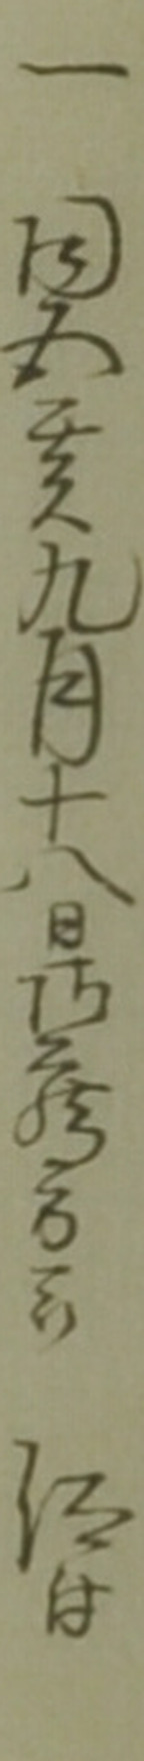一同五亥九月十八日御蔵方被仰付
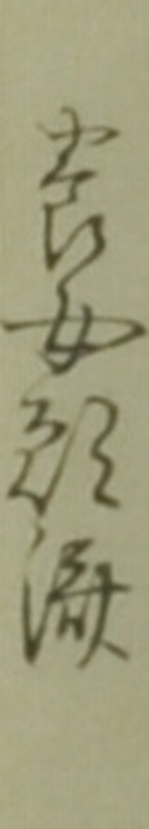養女願済

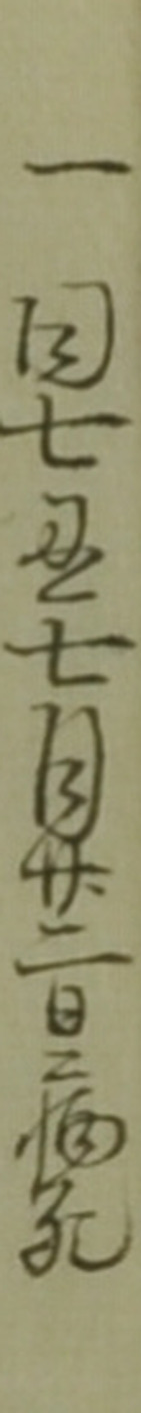一同七丑七月廿二日病死
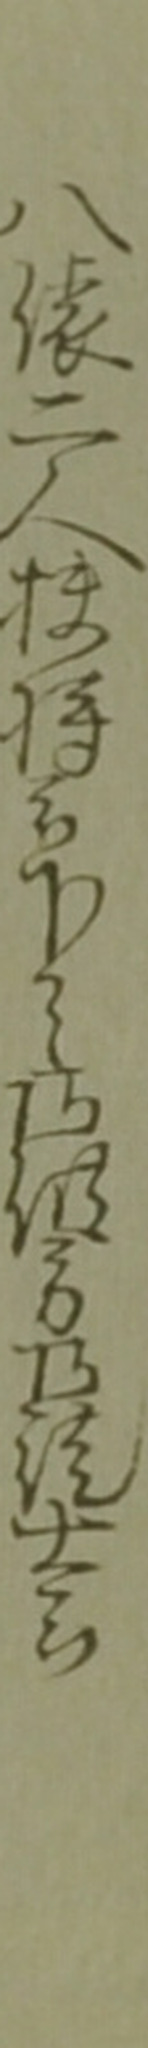八俵二人扶持被下之御供方御徒士被
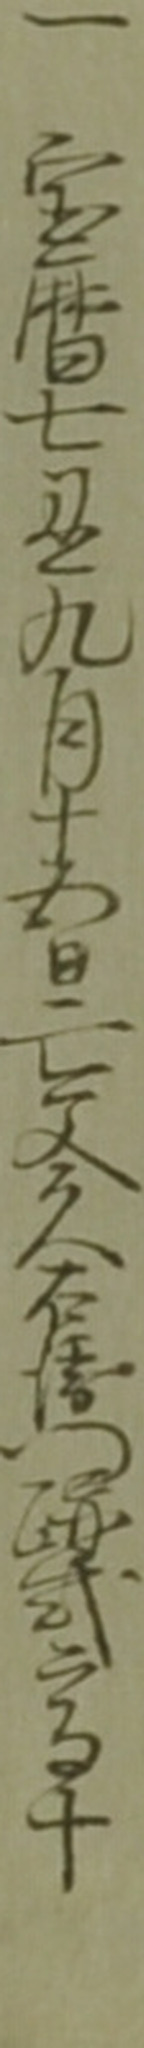一宝暦七丑九月十五日亡父久右衛門跡式高十
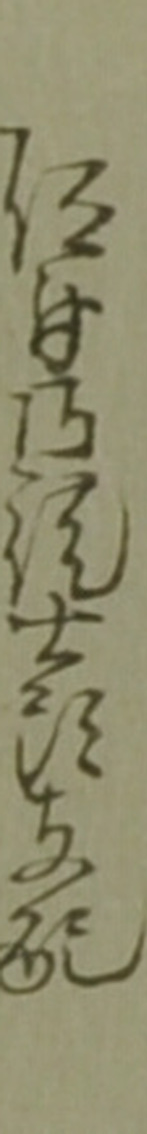仰付御徒士頭支配
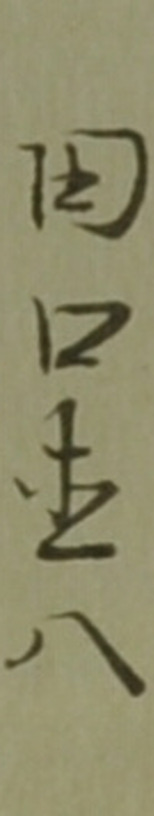田口直八
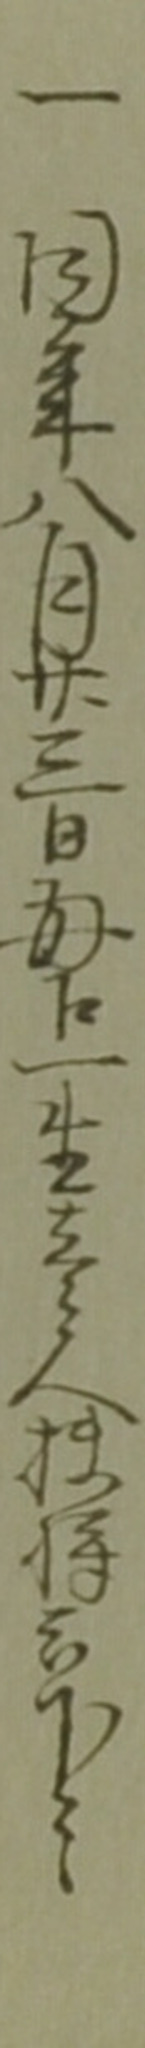一同年八月廿三日母江一生壱人扶持被下之
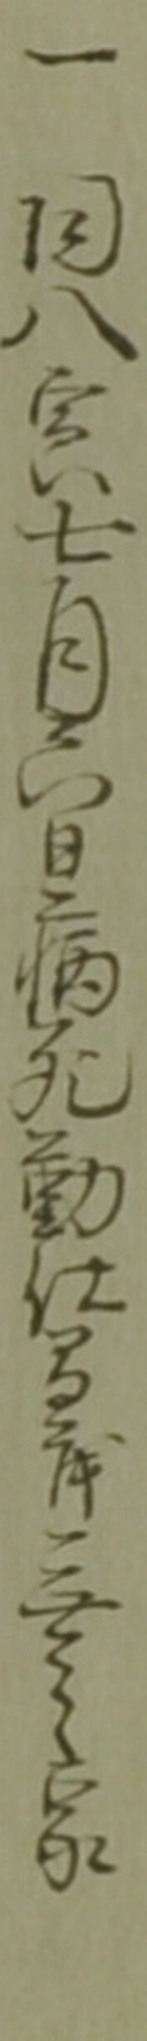一同八寅七月六日病死勤仕間茂無之家
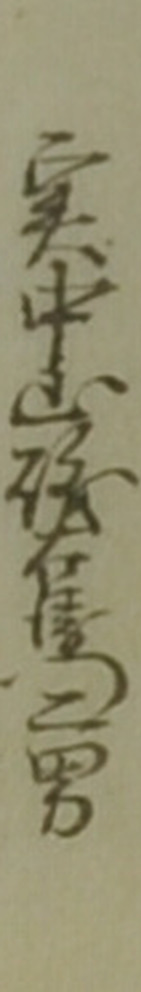実中山磯右衛門二男
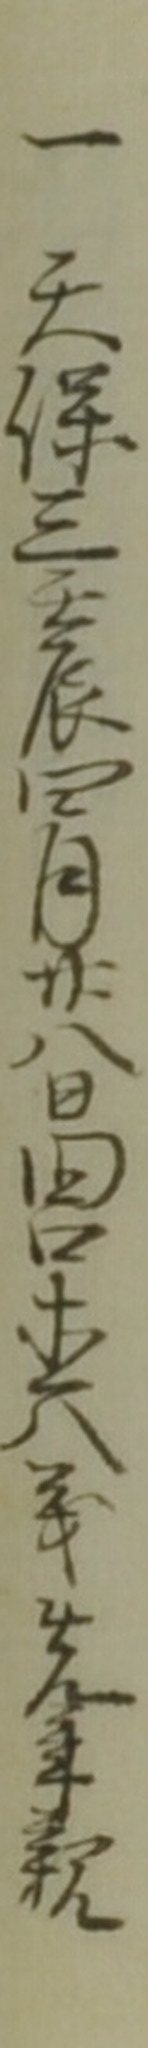一天保三壬辰四月廿八日田口直八義先年親
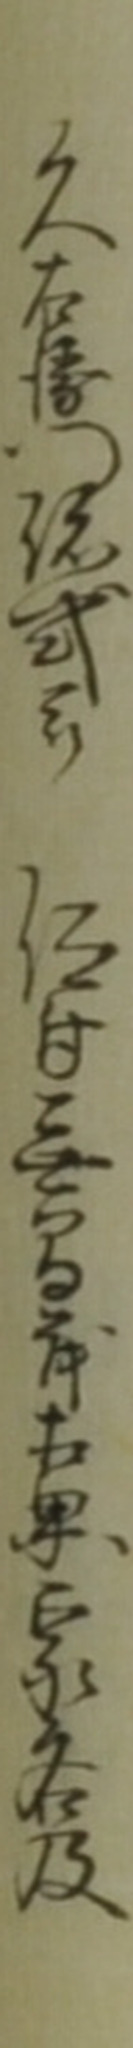久右衛門跡式被仰付無間茂相果家名及
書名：無足諸士勤仕録（九）
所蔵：伊那市立高遠町図書館・合同会社AMANE
